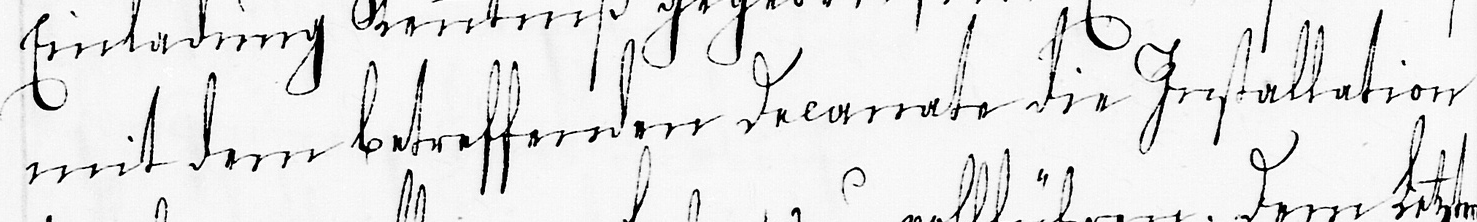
mit dem betreffenden Decanate die Installation
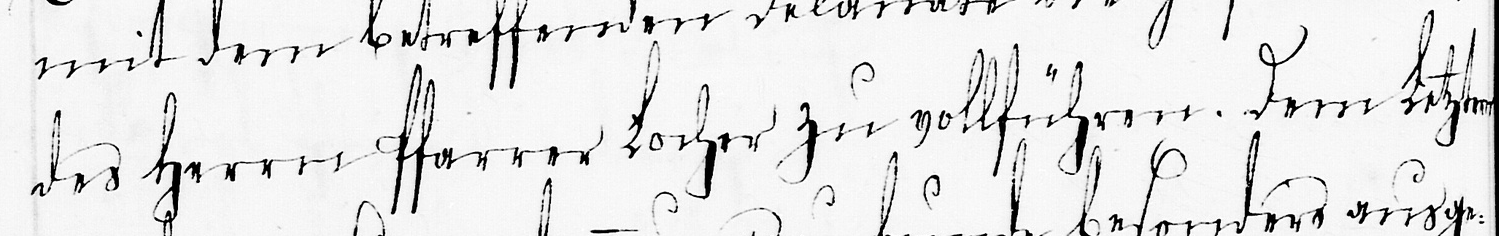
des Herrn Pfarrer Locher zu vollführen. Dem Letz¬
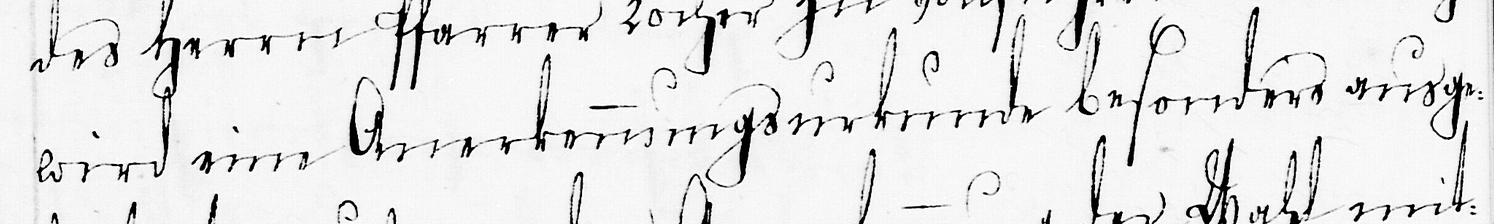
wird eine Anerkennungsurkunde besonders ausge¬
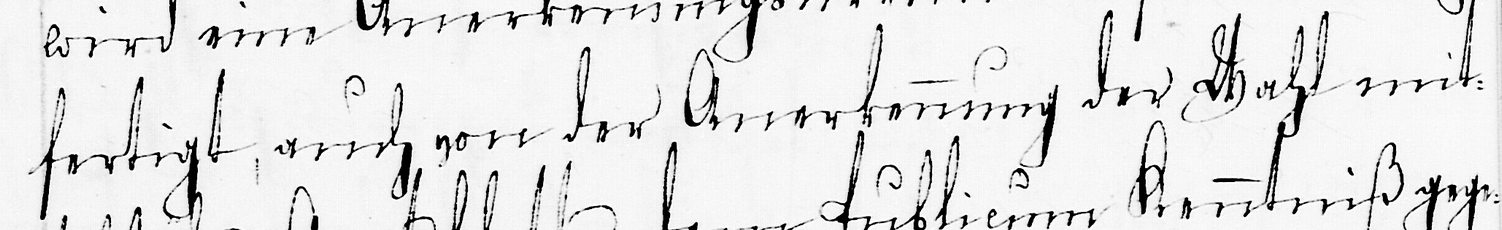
fertigt, auch von der Anerkennung der Wahl mit¬
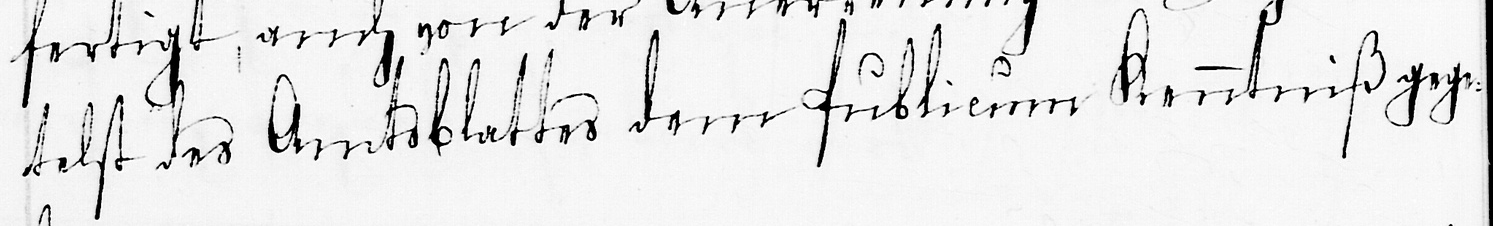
telst des Amtsblattes dem Publicum Kenntniß geg¬
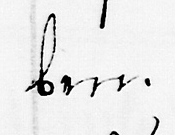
eben.
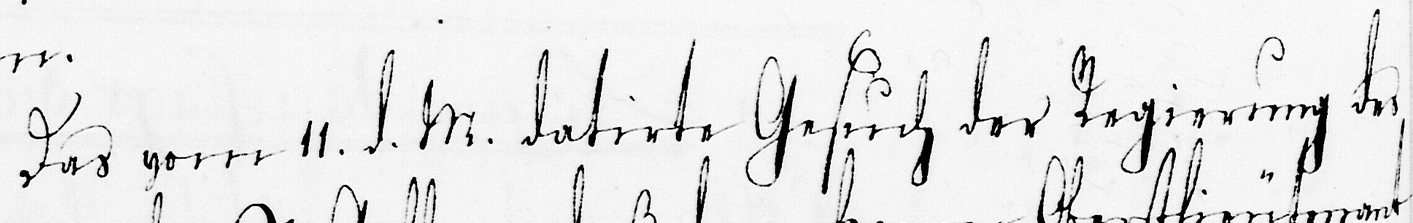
Das vom 11. d. M. datirte Gesuch der Regierung des
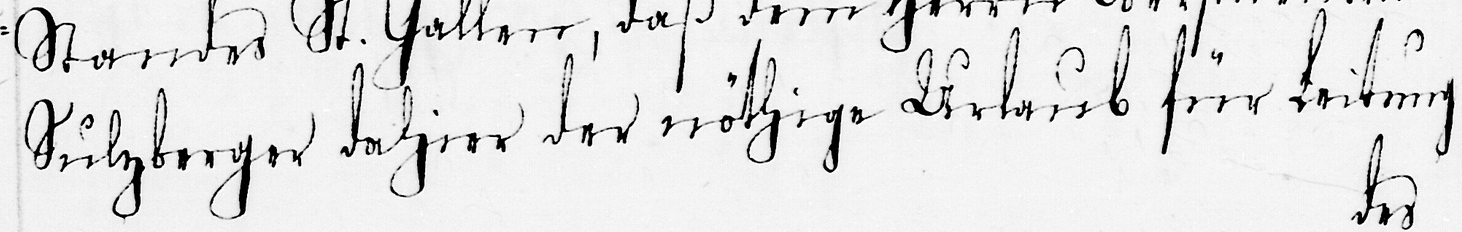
Sulzberger dahier der nöthige Urlaub für Leitung
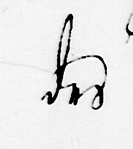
tern
